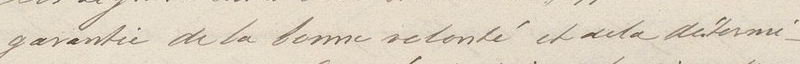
garantie de la bonne velouté et dela détermi-
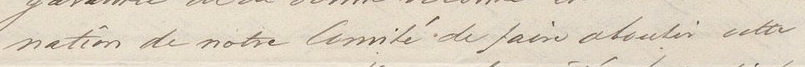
nation de notre Comité de faire aboutir cette
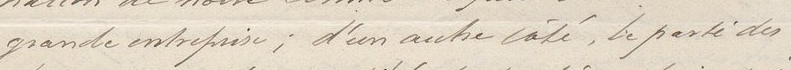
grande entreprise; d'un autre côté, le parti des
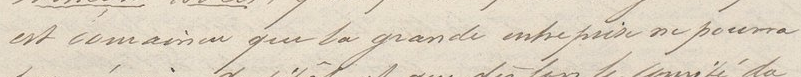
est convaincu que la grande entreprise ne pourra
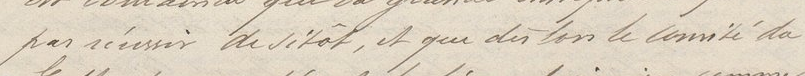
pas réussir de sitôt, et que dès lors le Comité du
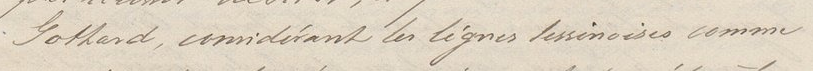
Gothard, considérant les lignes tessinoises comme
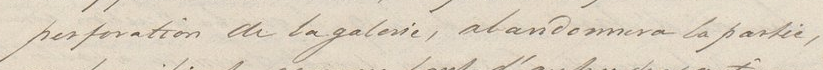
perforation de la galerie, abandonnera la partie,
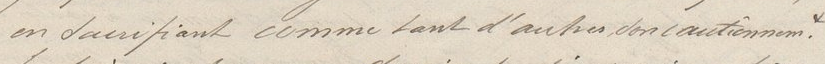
en sacrifiant comme tant d'autres son cautionnemt.
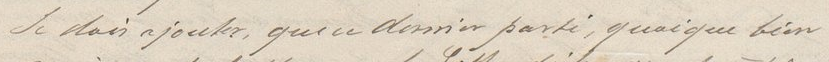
Je dois ajouter, que ce dernier parti, quoique bien
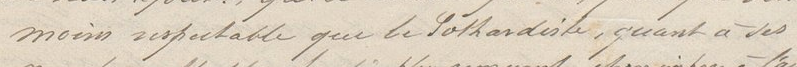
moins respectable que le Gothardiste, quant à ses
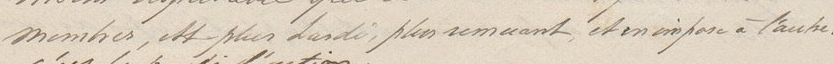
membres, est plus tardé, plus remuant, et en impose à l'autre.
